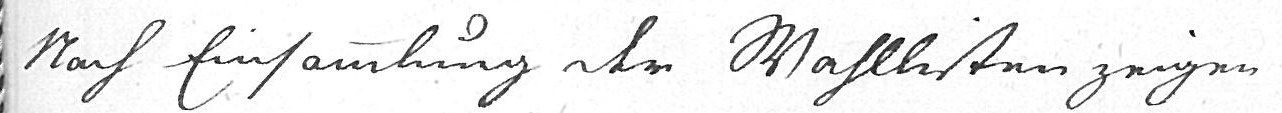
Nach Einsammlung der Wahllisten zeigen
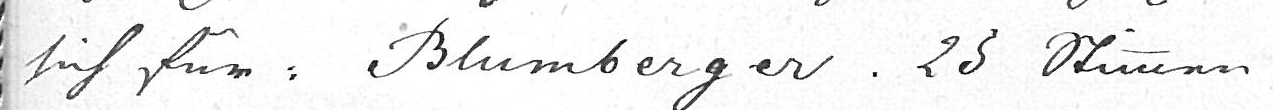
sich für Blumberger 25 Stimmen
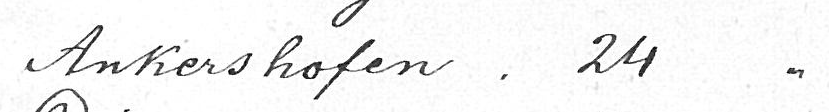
Ankershofen . 24 "
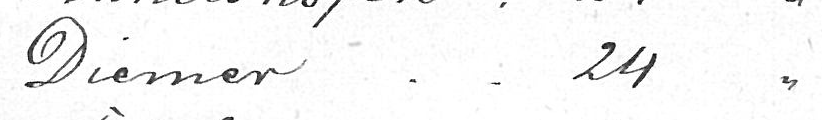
Diemer . . 24 "
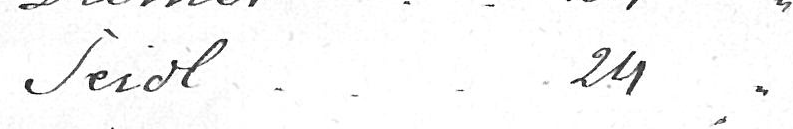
Seidl . . . . 24 "
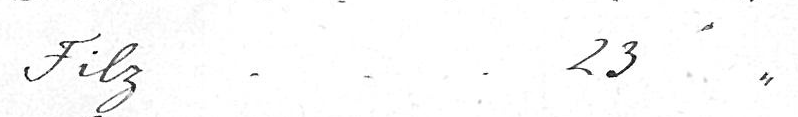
Filz . . . 23 "
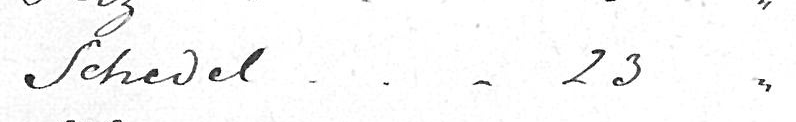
Schedel . . . 23 "
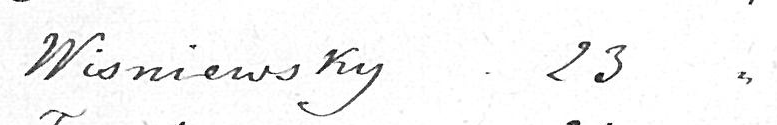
Wisniewsky . . . 23 "
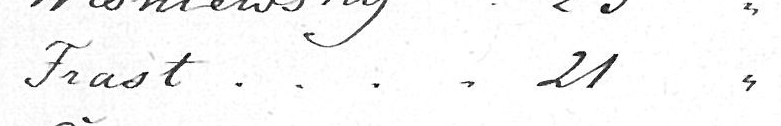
Frast . . . . 21 "
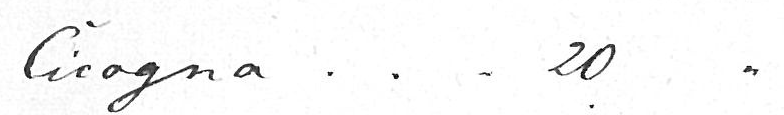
Cicogna . . . 20
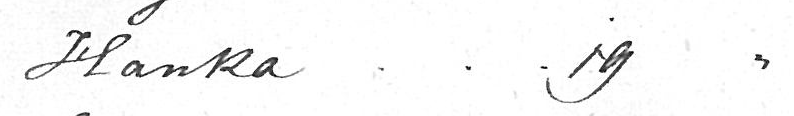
Hanka . . . 19 "
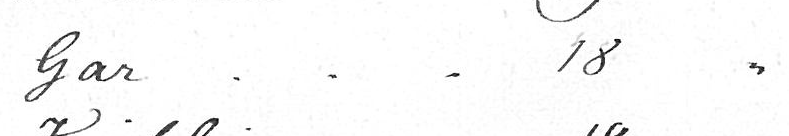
Gar : . . . 18 "
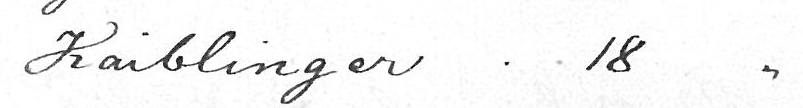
Kaiblinger . 18 "
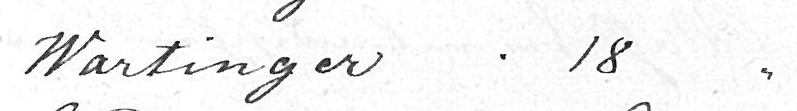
Wartinger . 18 "
